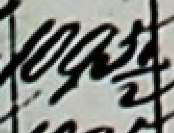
1095 1/2
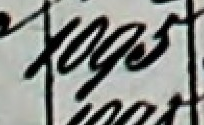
1095
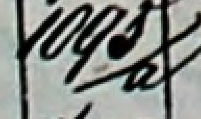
1095/a
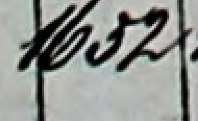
1652
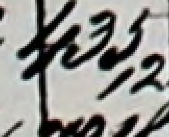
435,2
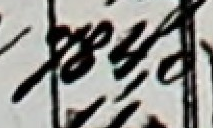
784,?
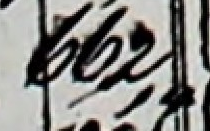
662
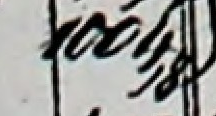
1004,8
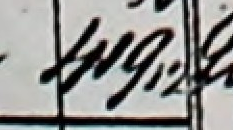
419/1
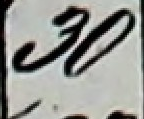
30
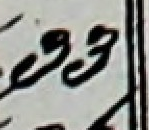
33
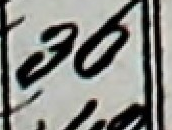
36
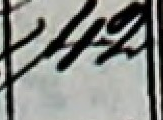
42
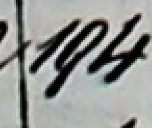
194
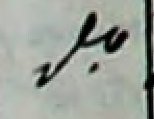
Do
